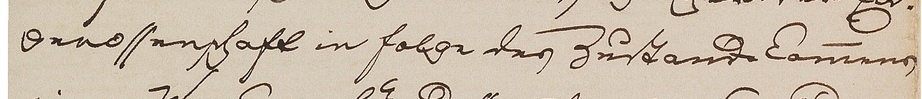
genossenschaft in Folge des Zustandekommens
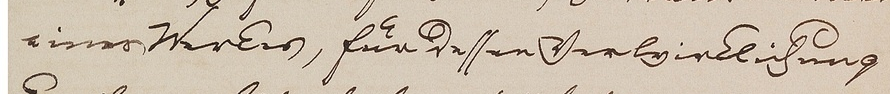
eines Werkes, für dessen Verwirklichung
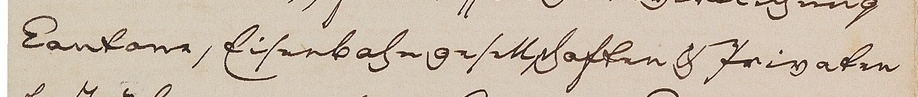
Cantone, Eisenbahngesellschaften & Privaten
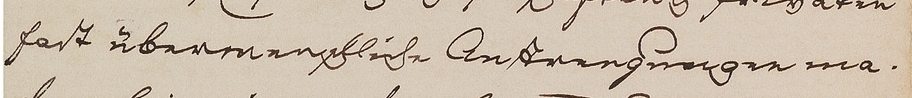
fast übermenschliche Anstrengungen ma-
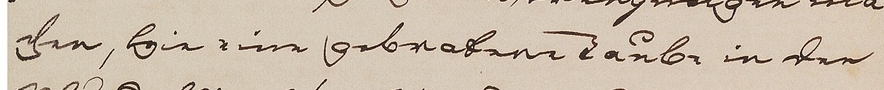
chen, wie eine gebratene Taube in den
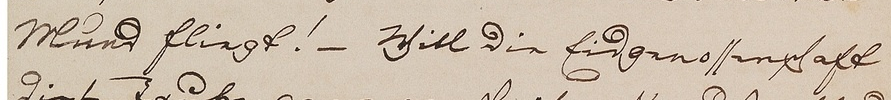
Mund fliegt! – Will die Eidgenossenschaft
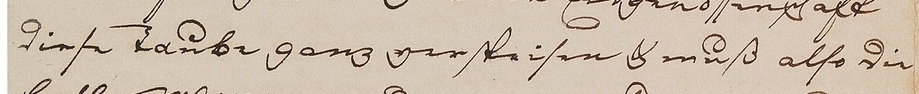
diese Taube ganz verspeisen & muß also die
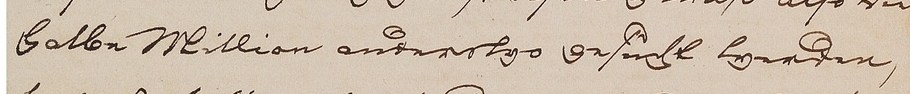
halbe Million anderswo gesucht werden,
